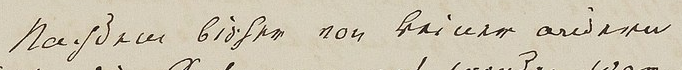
Nachdem bisher von keiner andern
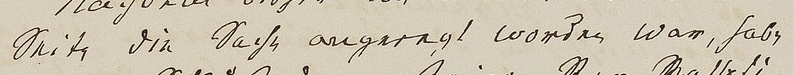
Seite die Sache angeregt worden war, habe
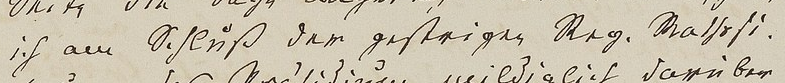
ich am Schluß der gestrigen Reg.Rathssi-
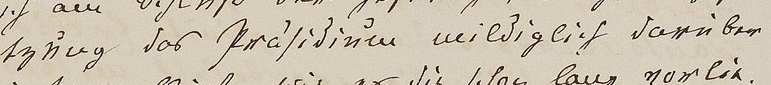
tzung das Präsidium mildiglich darüber
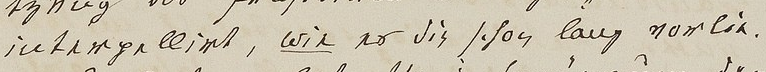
interpellirt, wie es die schon lang vorlie-
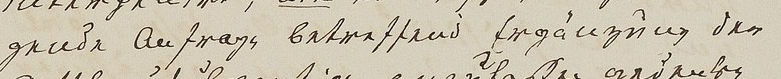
gende Anfrage betreffend Ergänzung der
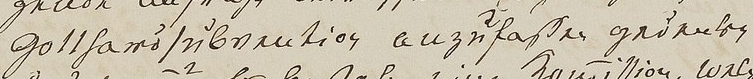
Gotthardsubvention anzufassen gedenke
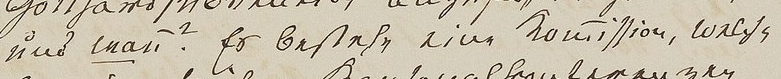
und wann? Es bestehe eine Kommission, welche
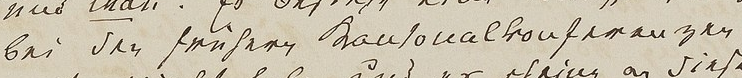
bei den frühern Kantonalkonferenzen
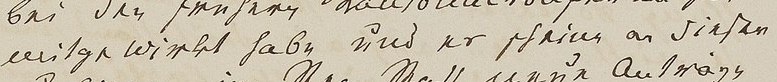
mitgewirkt habe und es scheine an dieser
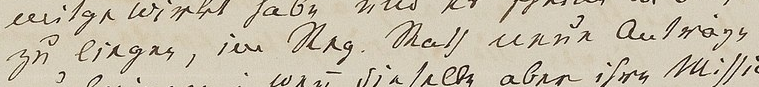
zu liegen, im Reg.Rath neue Anträge
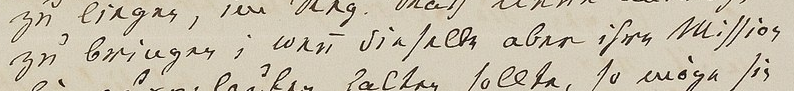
zu bringen; wenn dieselbe aber ihre Mission
